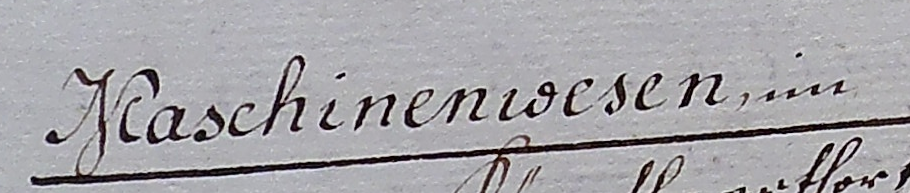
Maschinenwesen, im
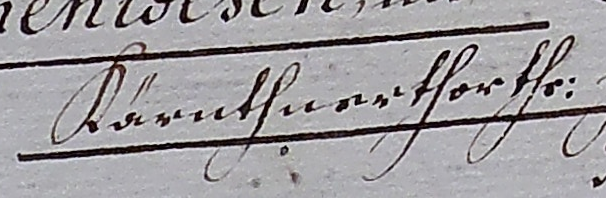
Kärnthnerthorthe:
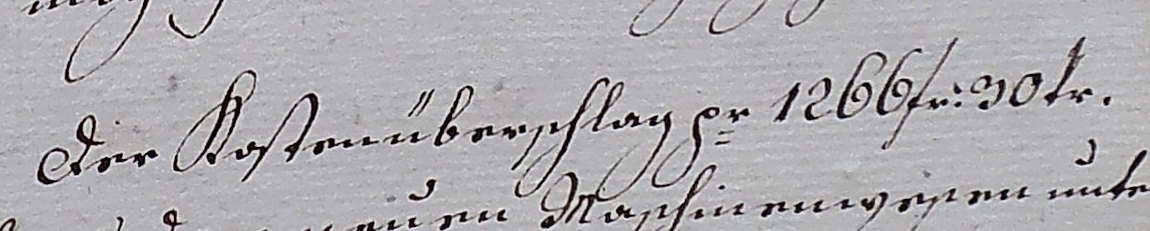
Der Kostenüberschlag pr͇ 1266fr. 30kr..
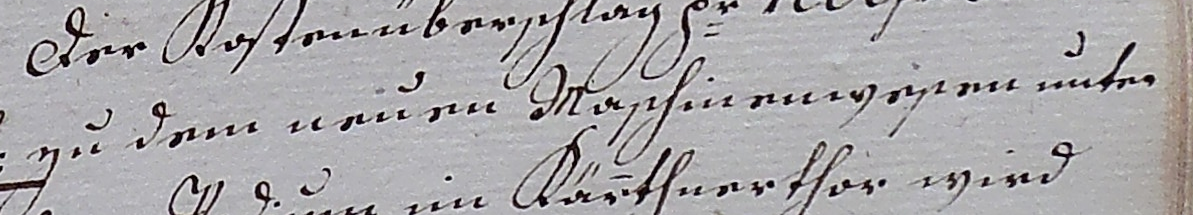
zu dem neuen Maschinenwesen unter
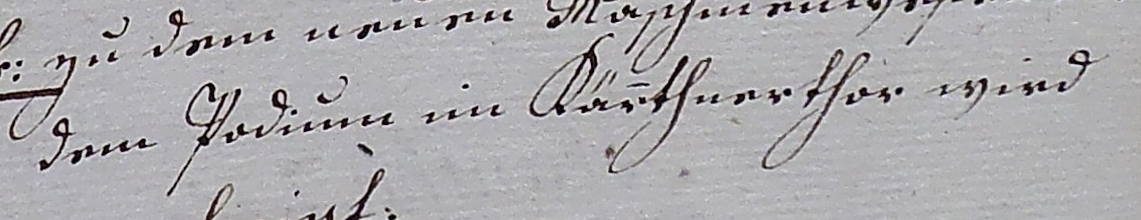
dem Podium im Kärthnerthor wird
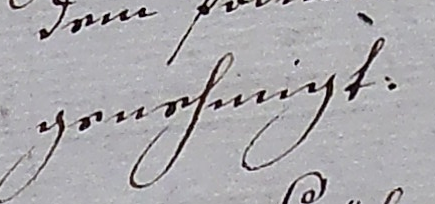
genehmigt.
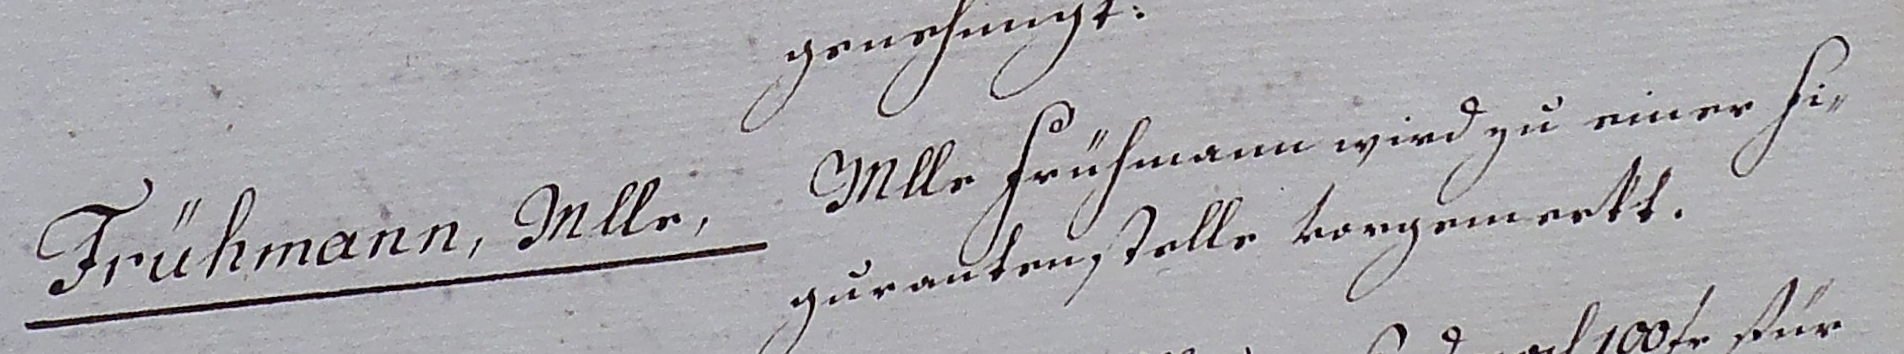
Frühmann, Mlle, Mlle Frühmann wird zu einer Fi¬
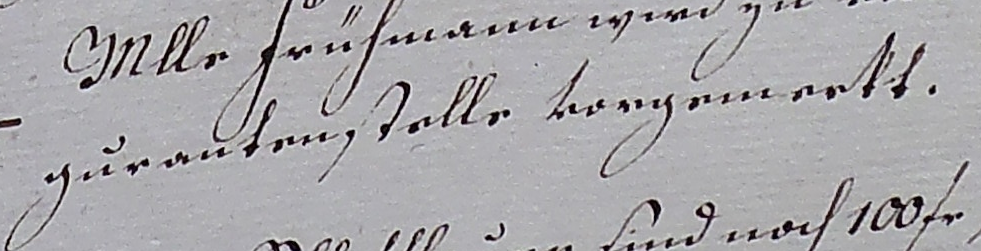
gurantenstelle vorgemerkt.
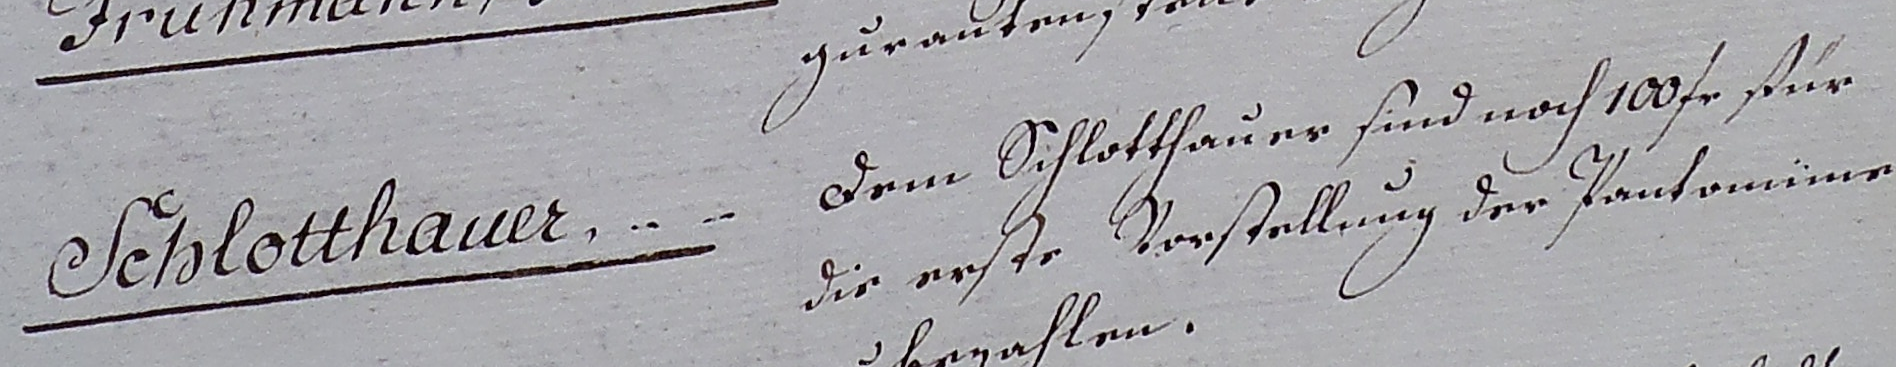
Schlotthauer. .. .. Dem Schlotthauer sind noch 100fr. für
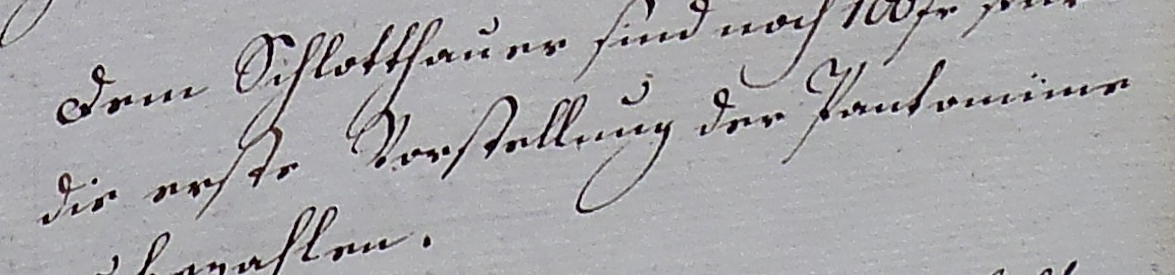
die erste Vorstellung der Pantomime
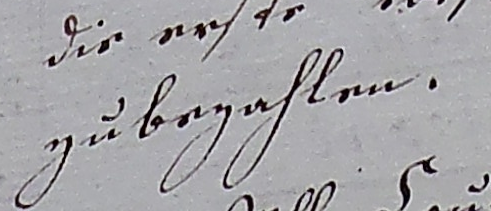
zubezahlen.
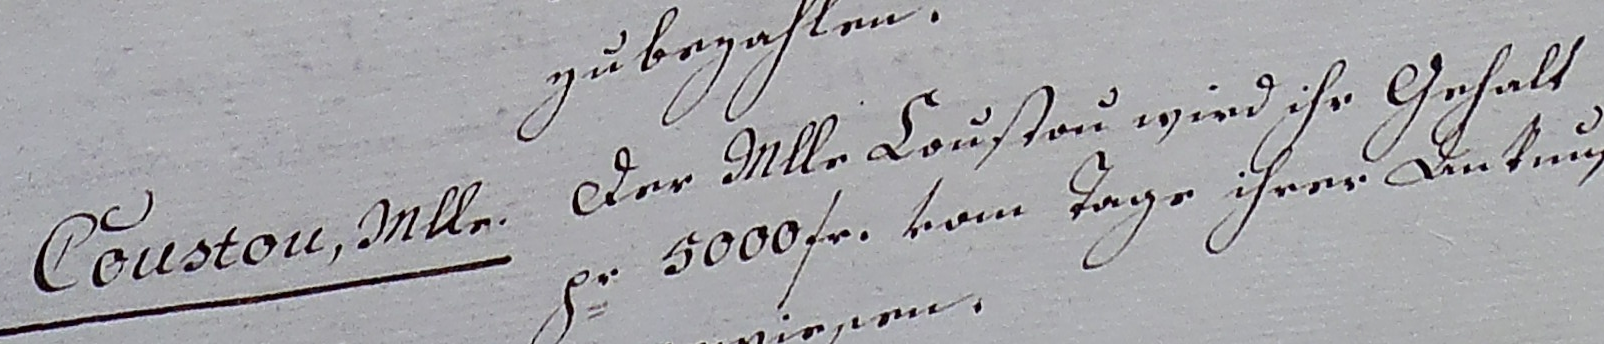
Coustou, Mlle. Der Mlle Coustou wird ihr Gehalt
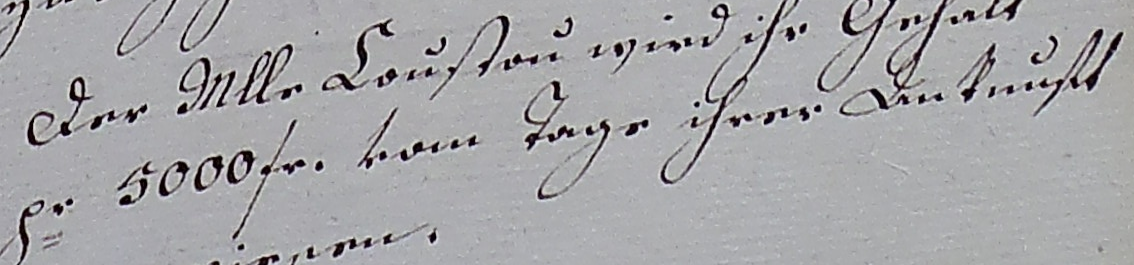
pr͇ 5000fr. vom Tage ihrer Ankunft
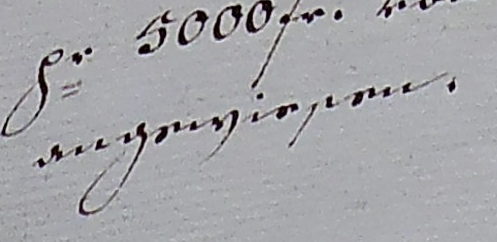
angewiesen.
